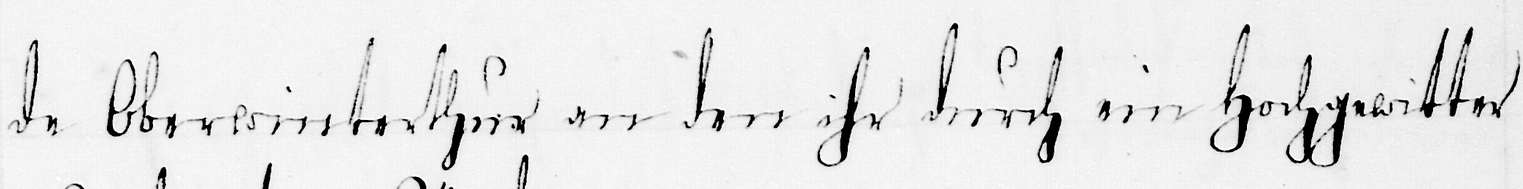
de Oberwinterthur an den ihr durch ein Hochgewitter
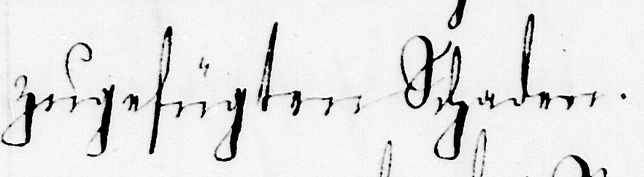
zugefügten Schaden.
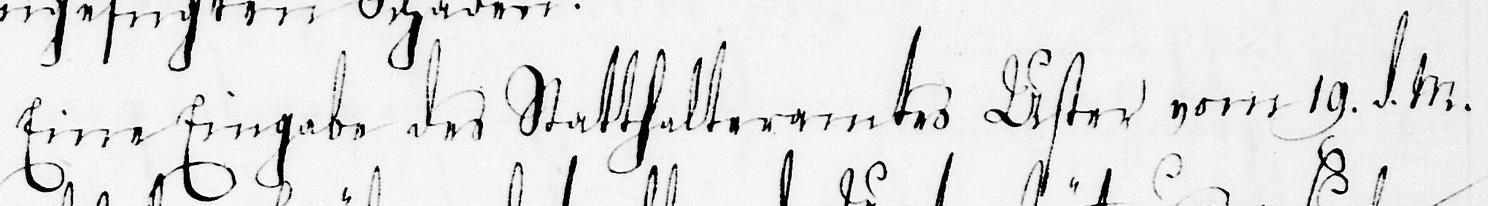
Eine Eingabe des Statthalteramtes Uster vom 19. d. M.
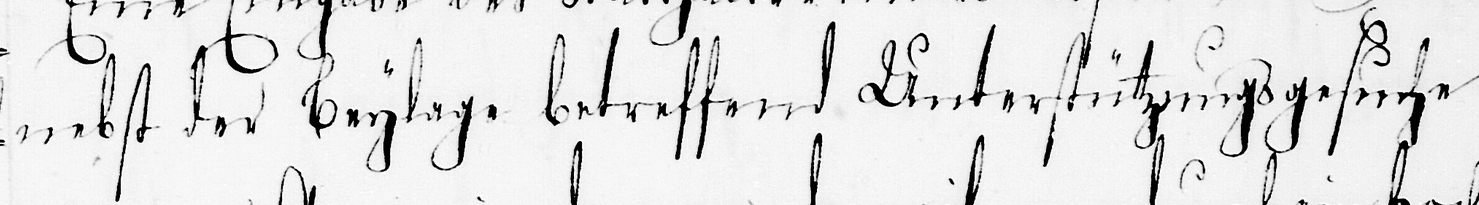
nebst der Beylage betreffend Unterstützungsgesuche
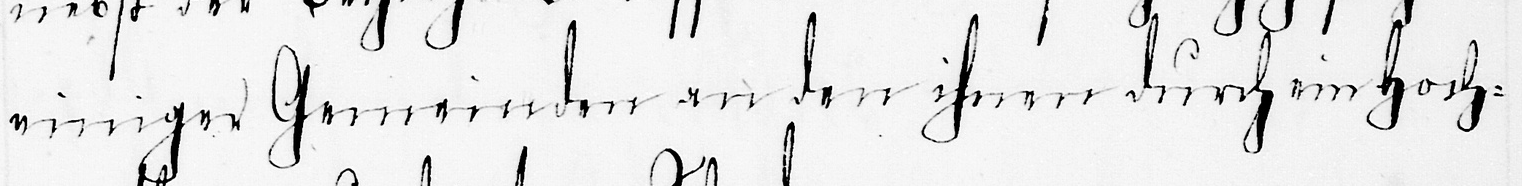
einiger Gemeinden an den ihnen durch ein Hoch¬
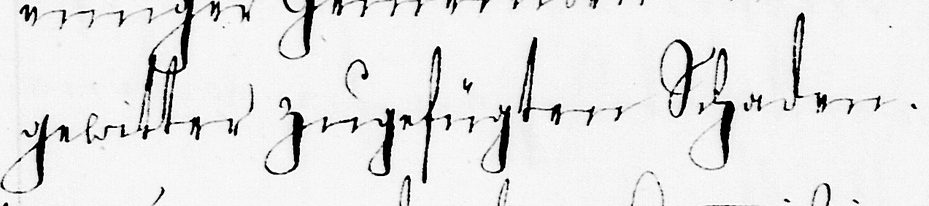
gewitter zugefügten Schaden.
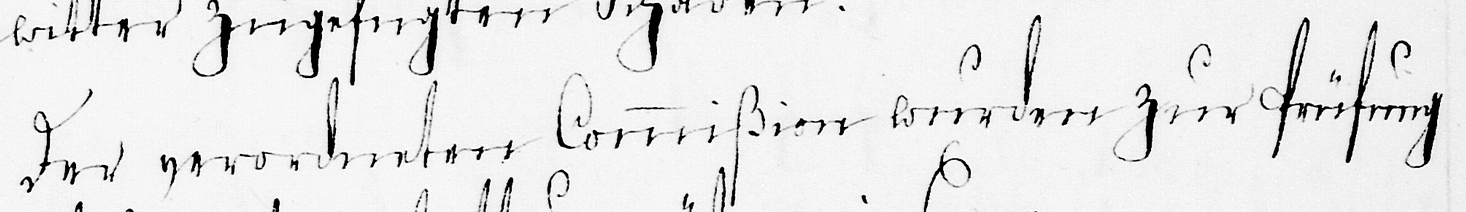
Der verordneten Commißion wurden zur Prüfung
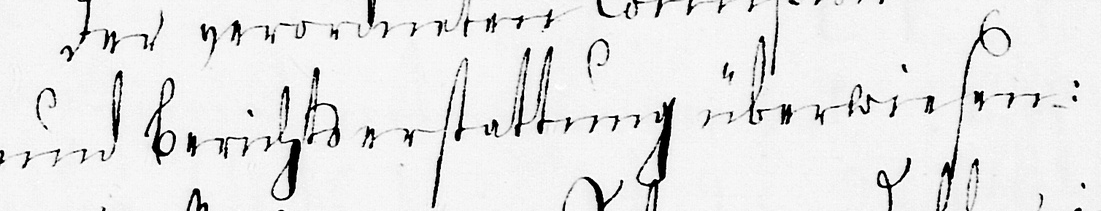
und Berichtserstattung überwiesen:
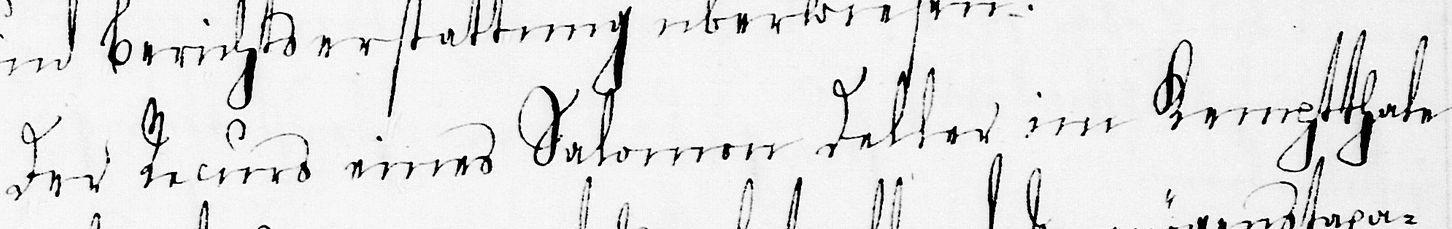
Der Recurs eines Salomon Deller im Kemptthale
